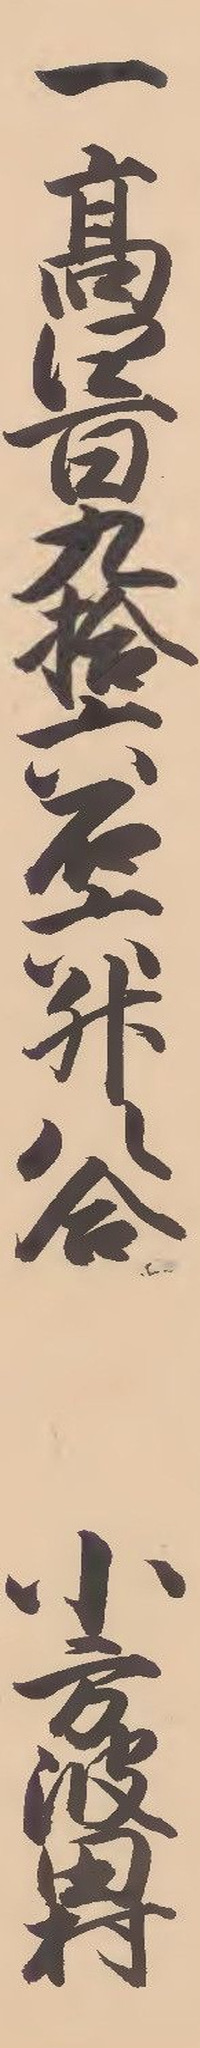一高四百九拾六石六升八合小方波田村

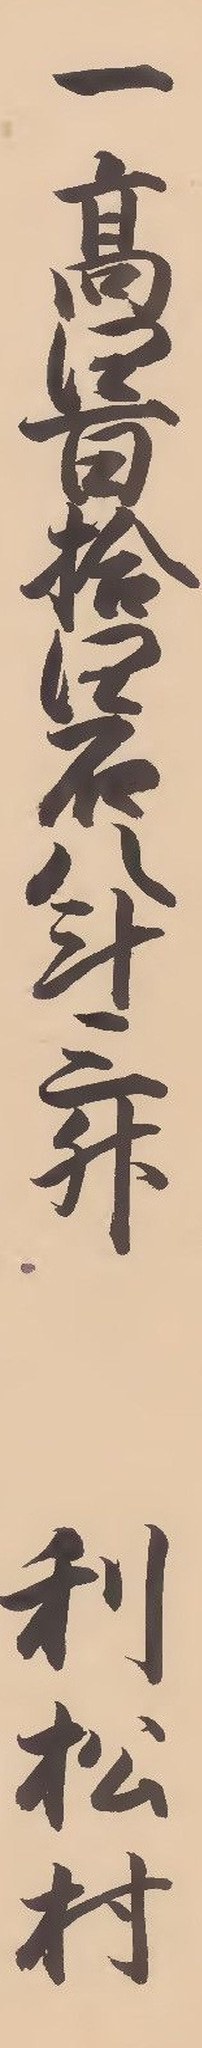一高四百拾四石八斗三升利松村
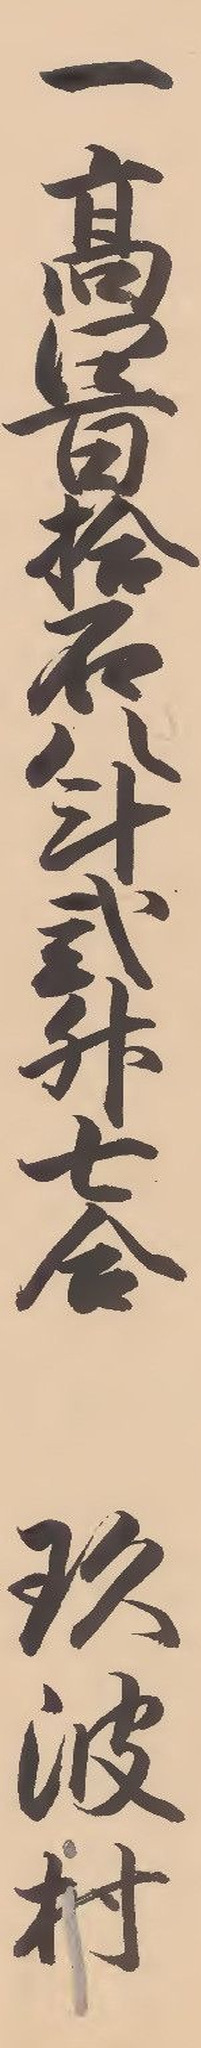一高四百拾石八斗弐升七合玖波村
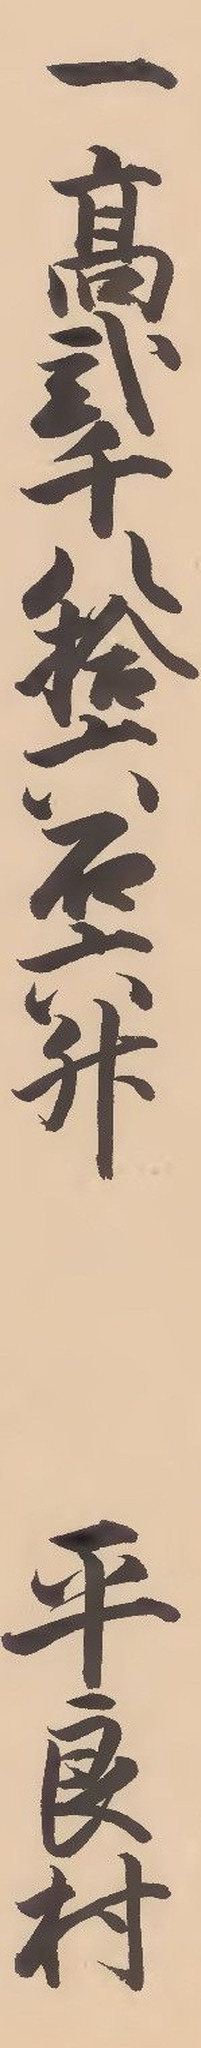一高弐千八拾六石六升平良村
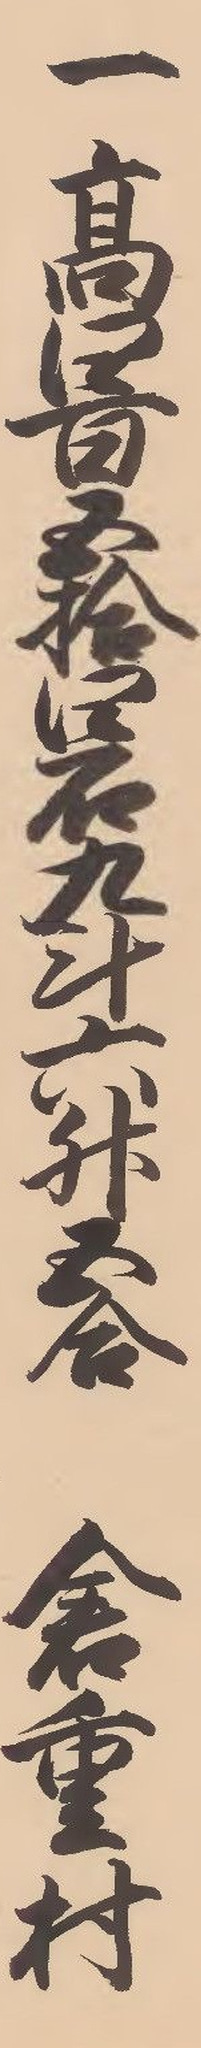一高四百五拾四石九斗六升五合倉重村
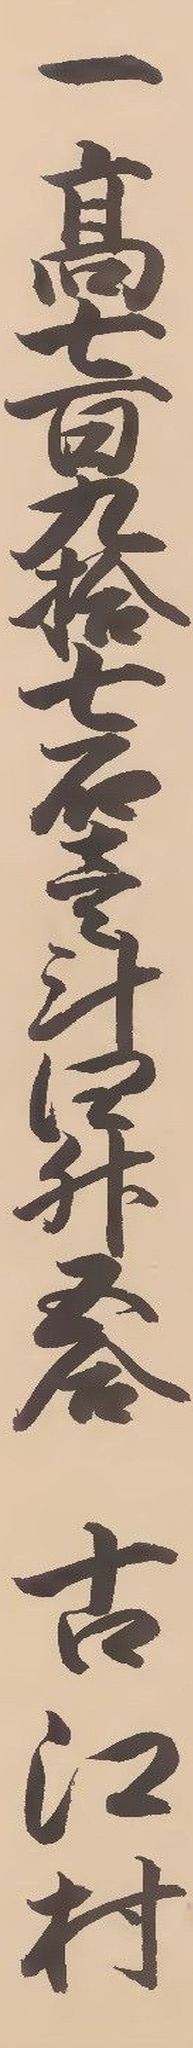一高七百九拾七石壱斗四升五合古江村
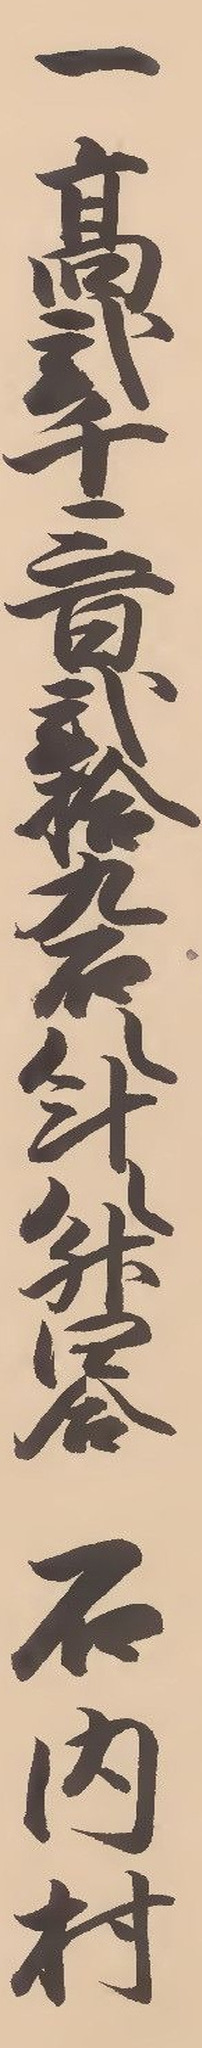一高弐千三百弐拾九石八斗八升四合石内村
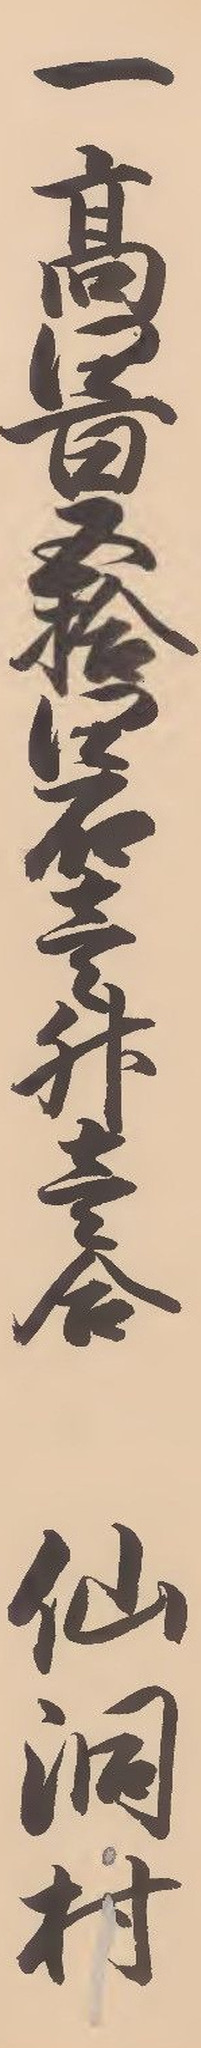一高四百五拾四石壱升壱合仙洞村
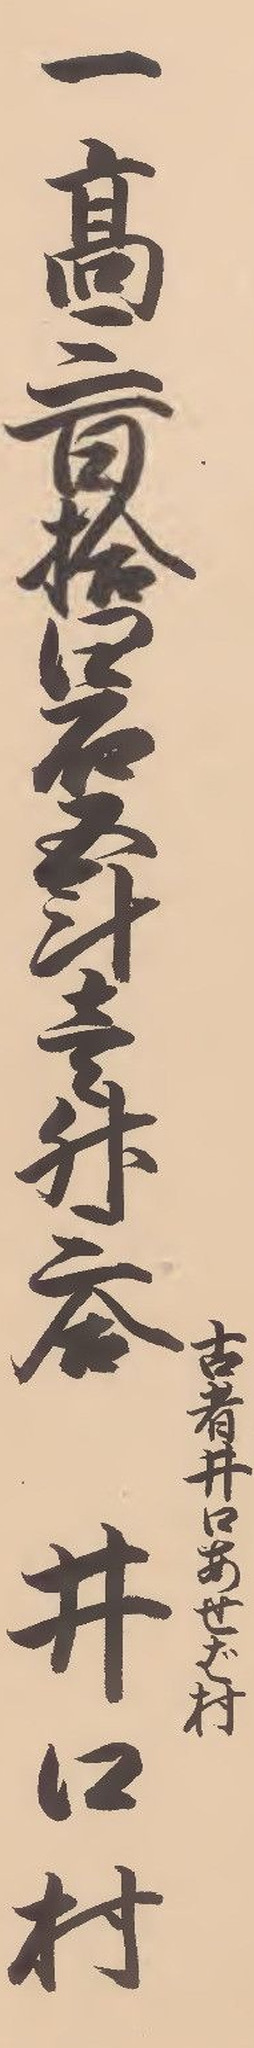一高三百拾四石五斗壱升三合井口村

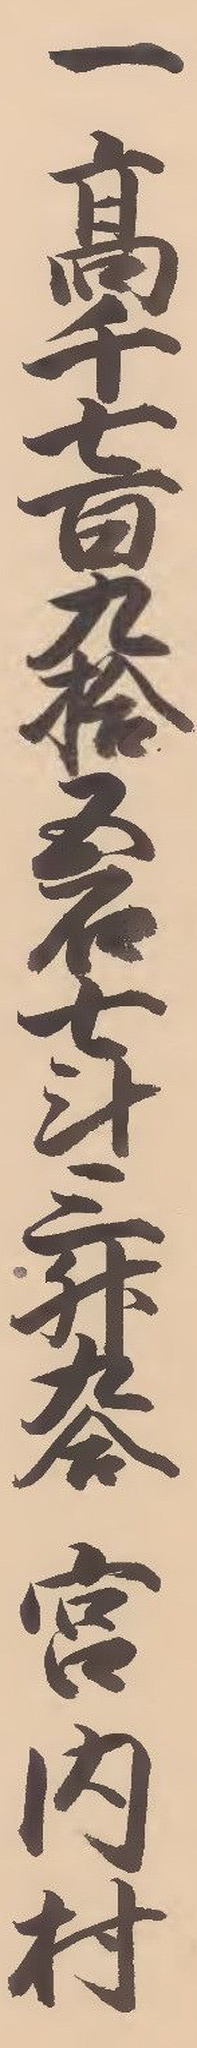一高千七百九拾五石七斗三升九合宮内村
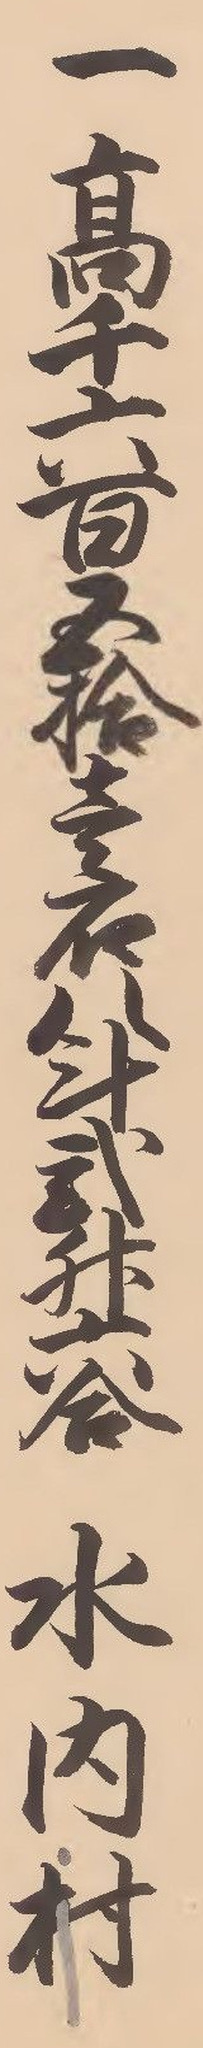一高千六百五拾壱石八斗弐升六合水内村
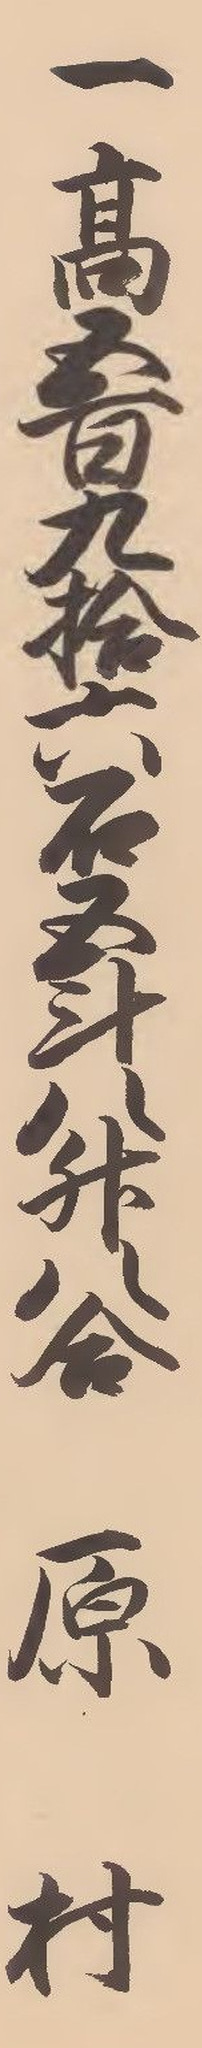一高五百九拾六石五斗八升八合原村
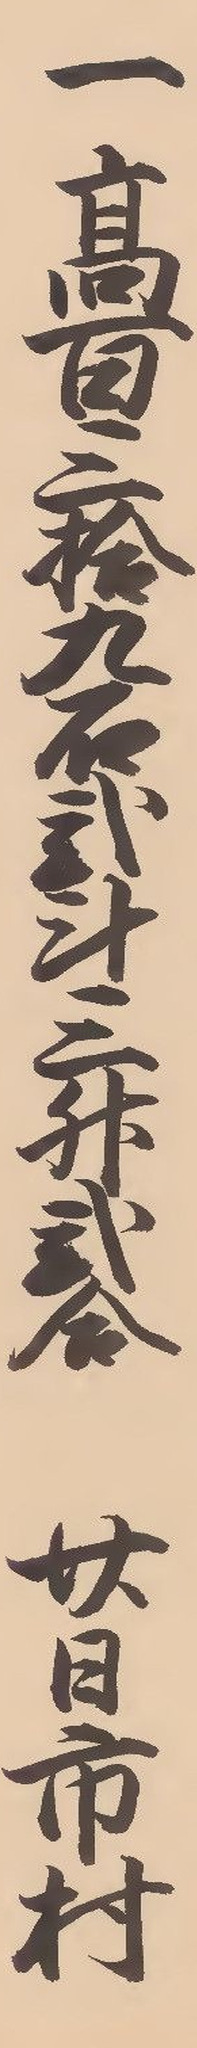一高百三拾九石弐斗三升弐合廿日市村
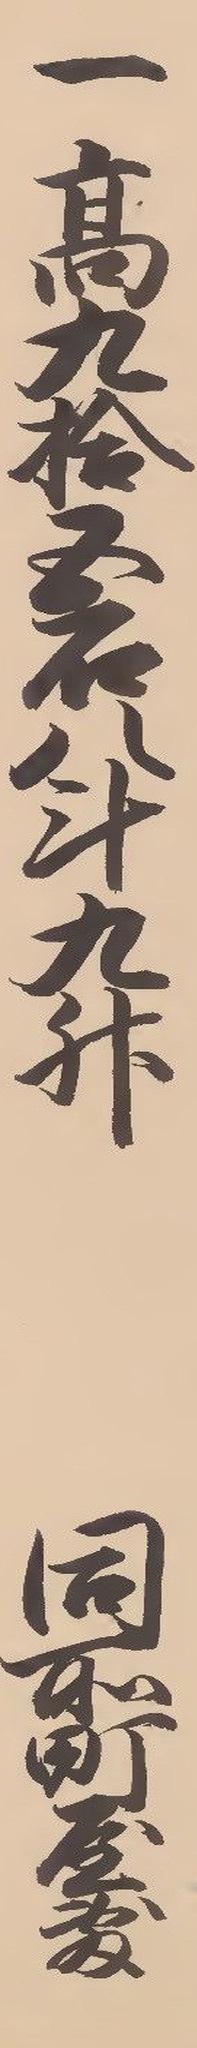一高九拾五石八斗九升同所町屋敷
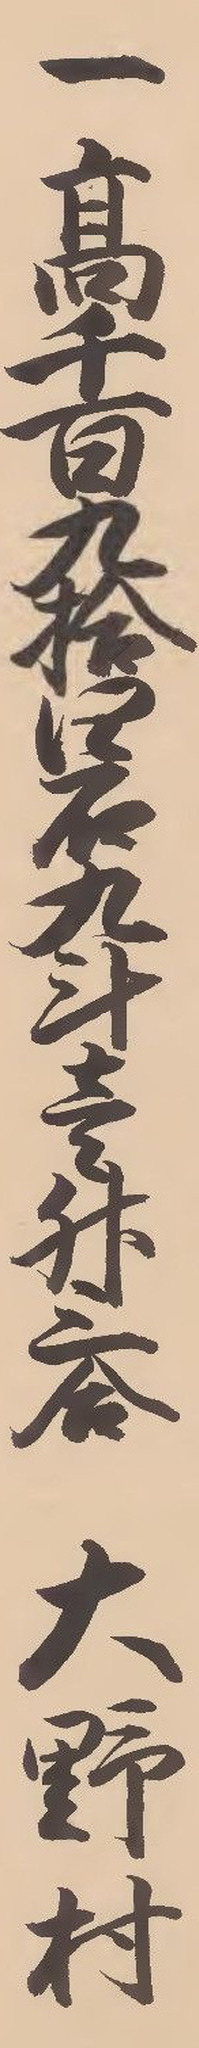一高千百九拾四石九斗壱升三合大野村
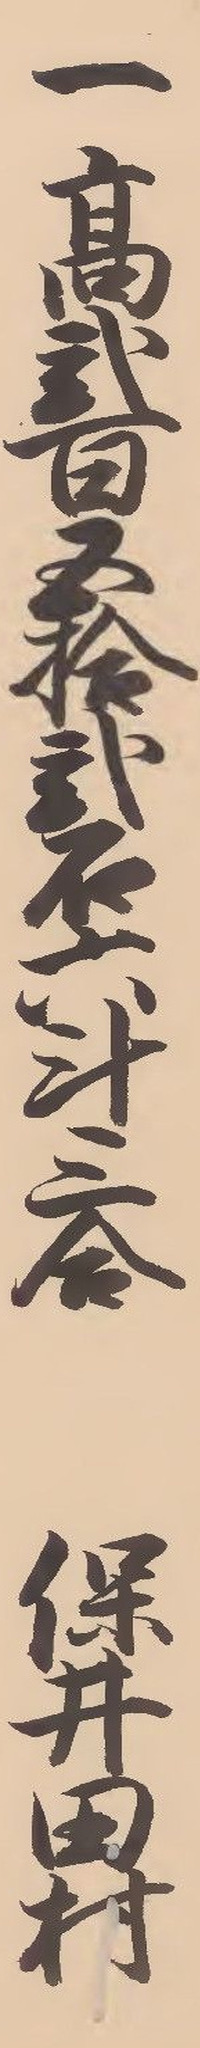一高弐百五拾弐石六斗三合保井田村
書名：安芸国郷帳
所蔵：国立公文書館 National Archives of Japan
